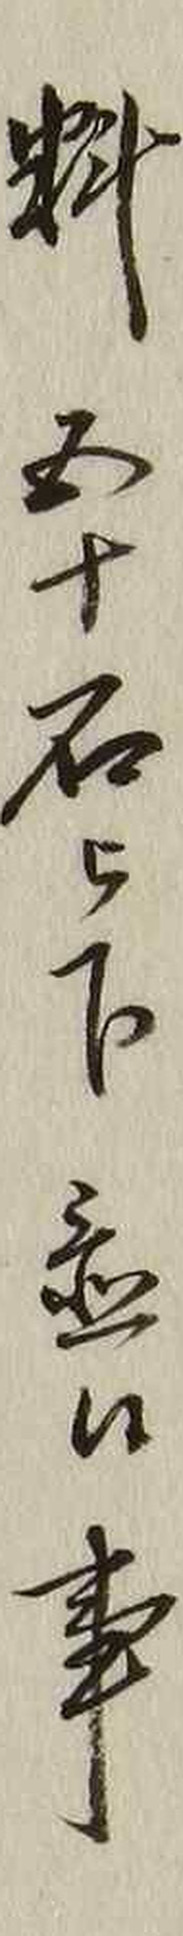料五十石被下置候事
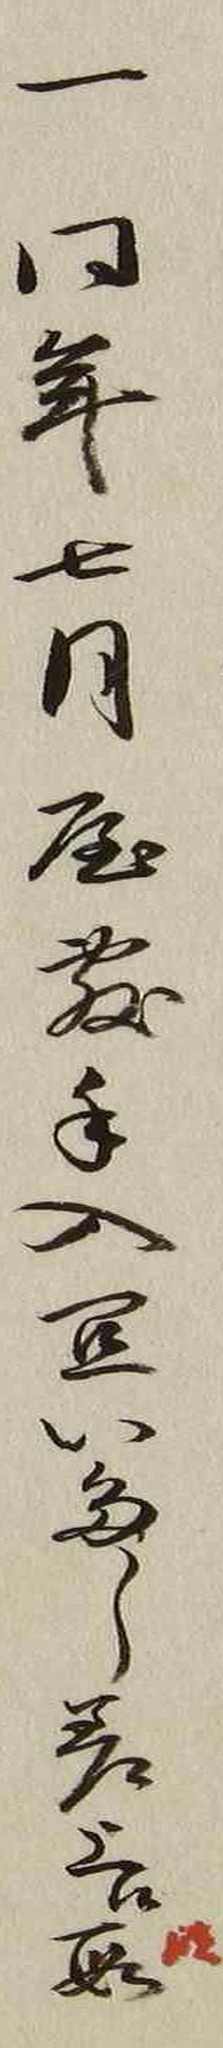一同年七月屋敷手入宜いたし差上候段
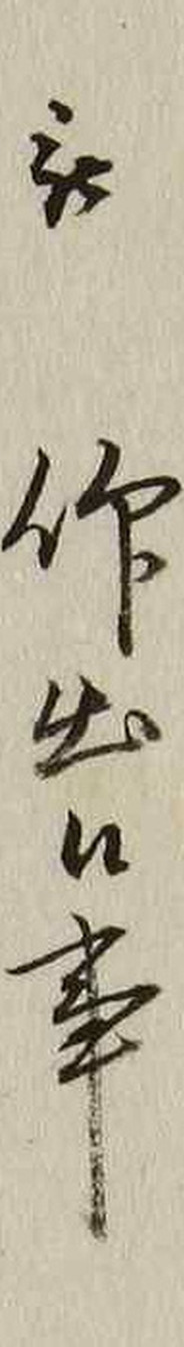被仰出候事
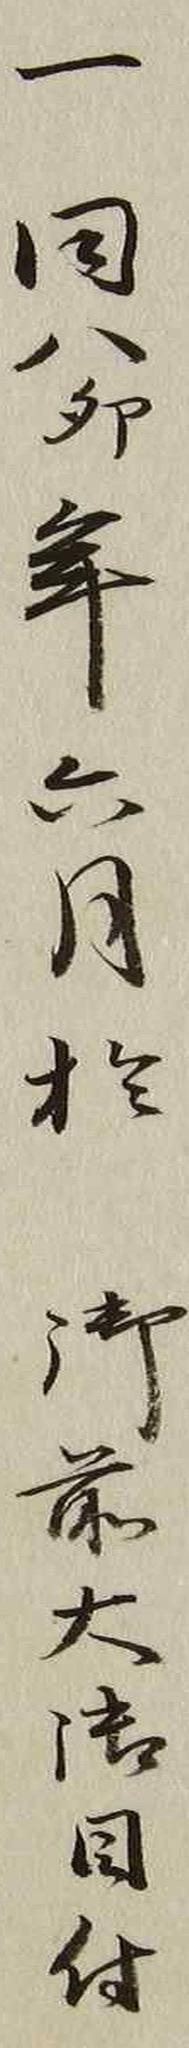一同八卯年六月於御前大御目付
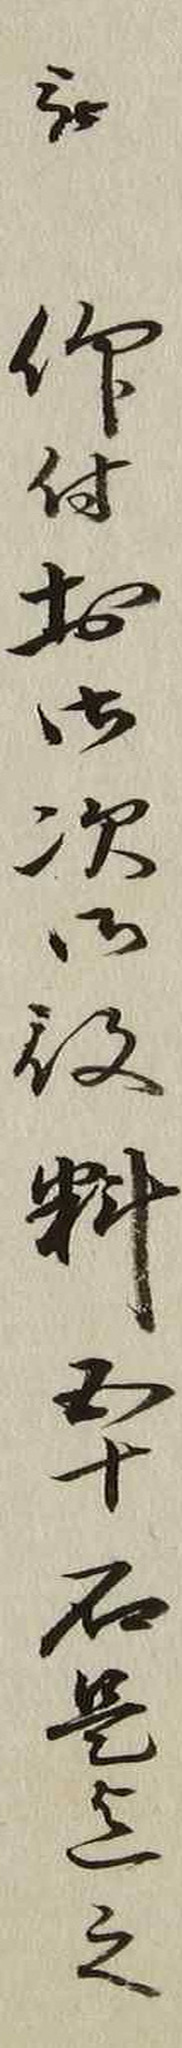被仰付於御次御役料五十石是迄之
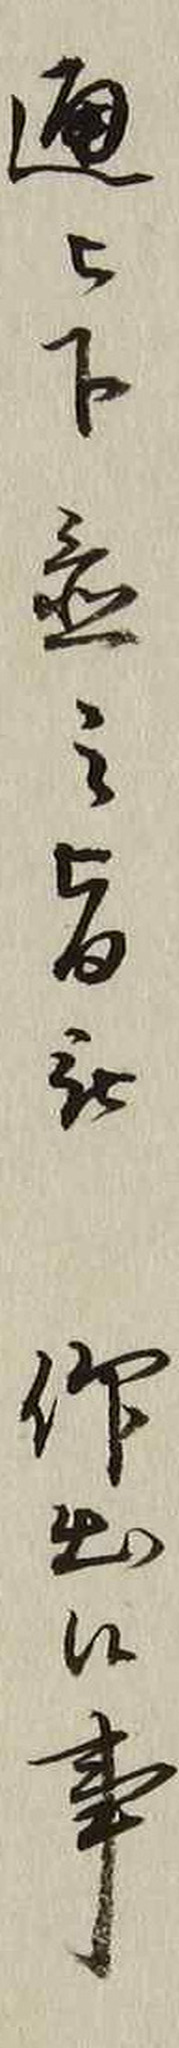通被下置之旨被仰出候事
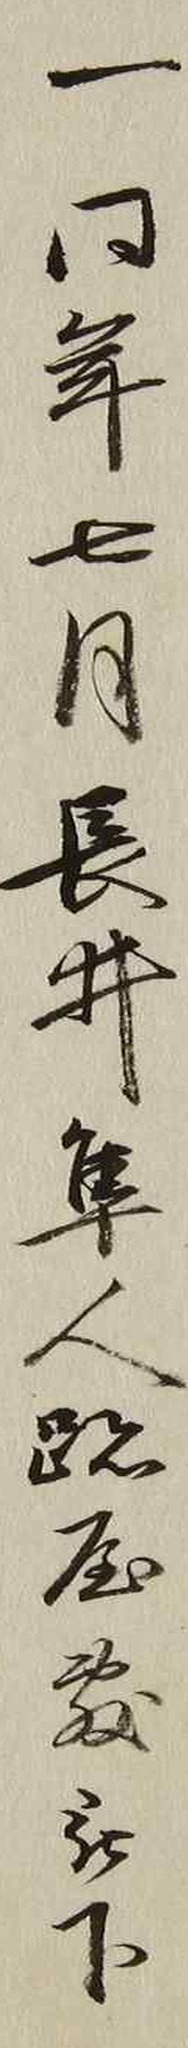一同年七月長井隼人跡屋敷被下
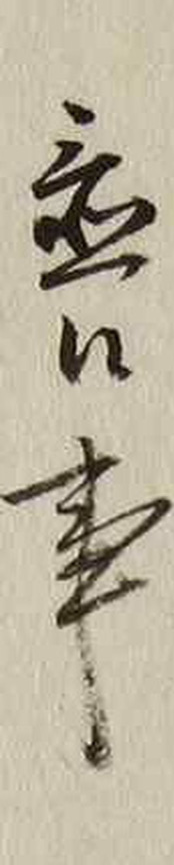置候事
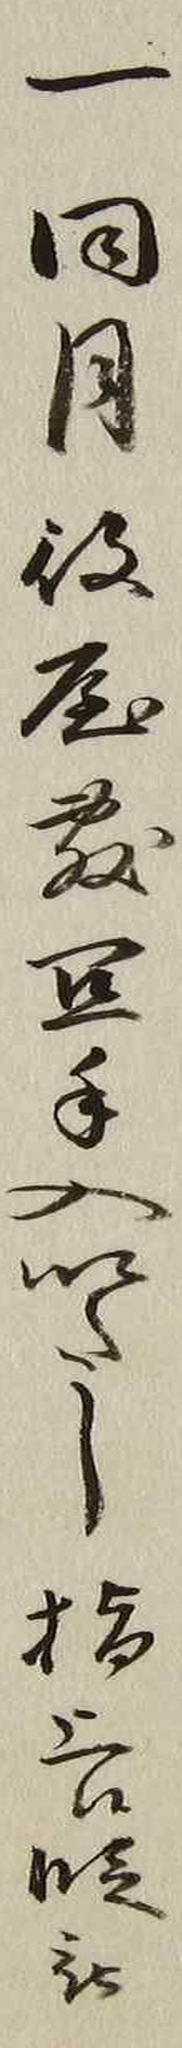一同月役屋敷宜手入いたし指上候段被
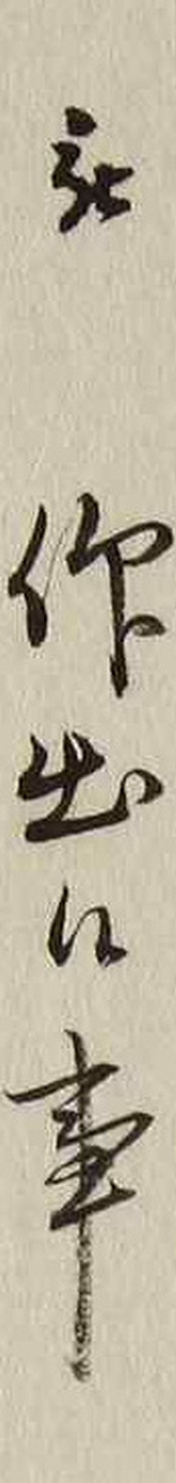被仰出候事
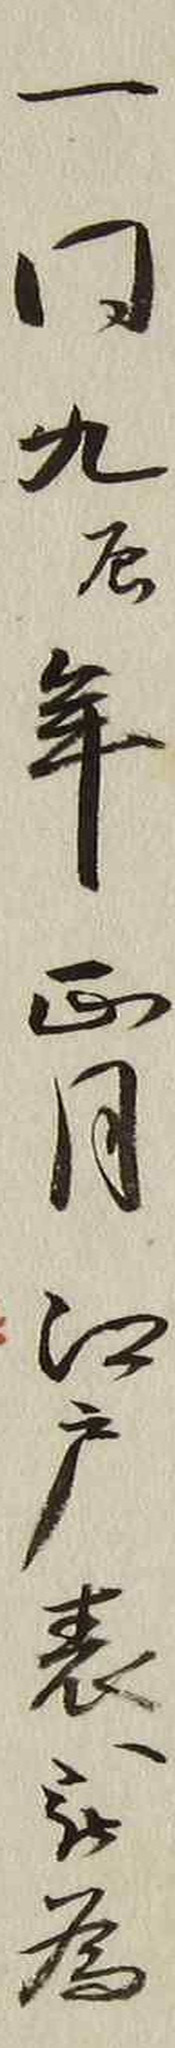一同九辰年正月江戸表へ被為
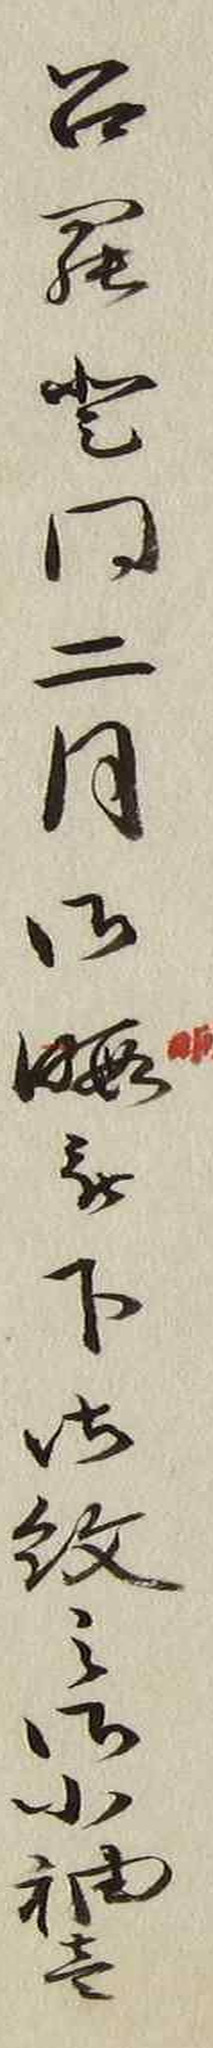召罷登同二月御暇被下御紋之御小袖壱
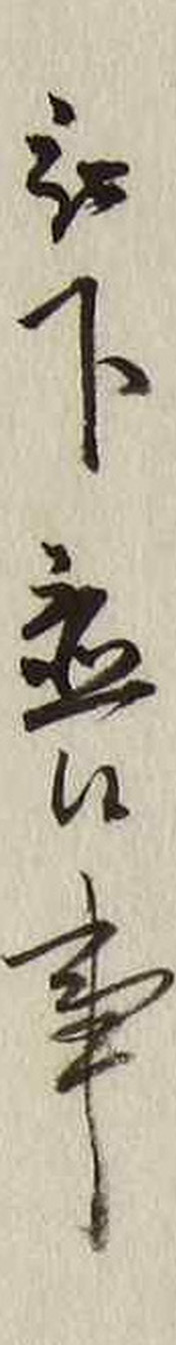被下置候事
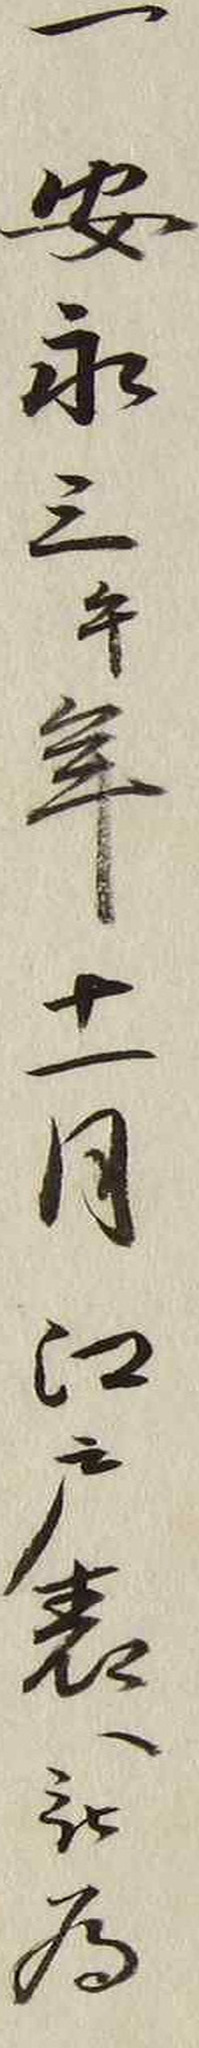一安永三午年十一月江戸表へ被為
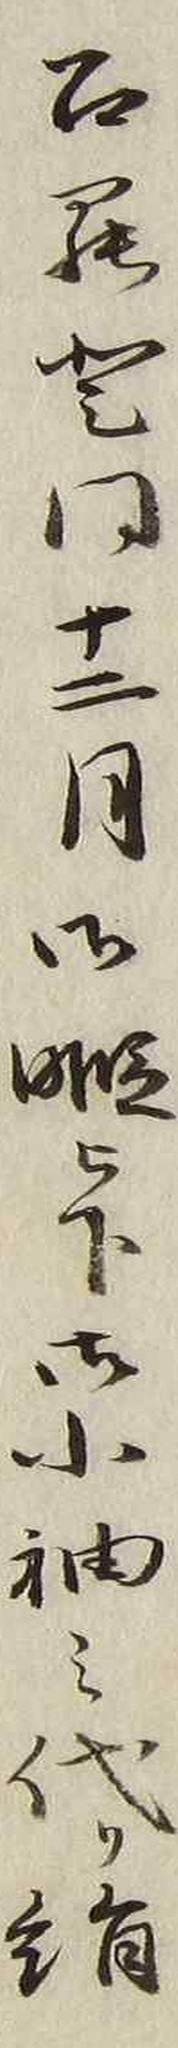召罷登同十二月御暇被下御小袖之代り絹
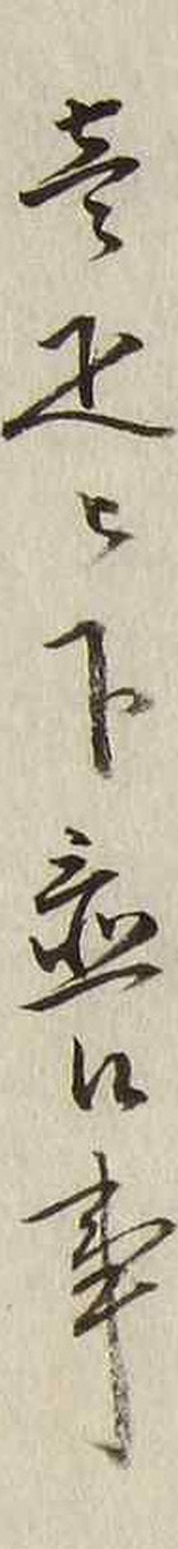壱疋被下置候事
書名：諸士系譜　巻之160　な之部2
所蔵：会津若松市立会津図書館
